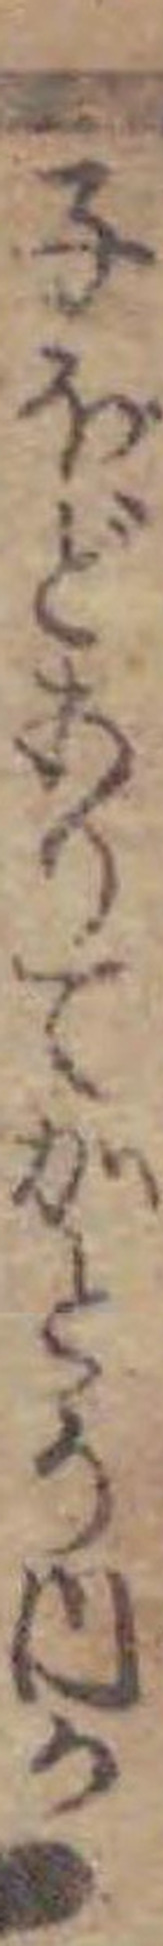子ほどありてかとう内か
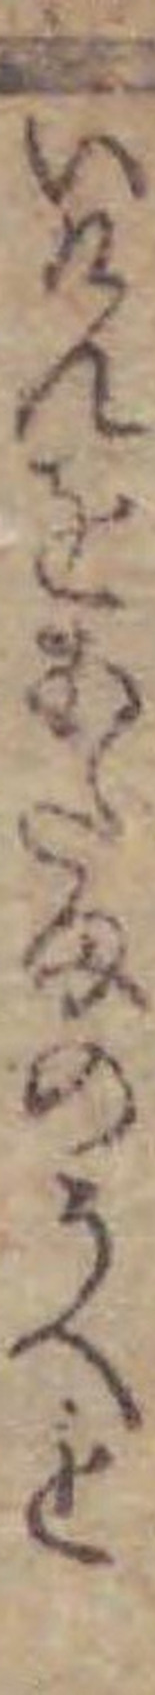いけんをあたまのうへを
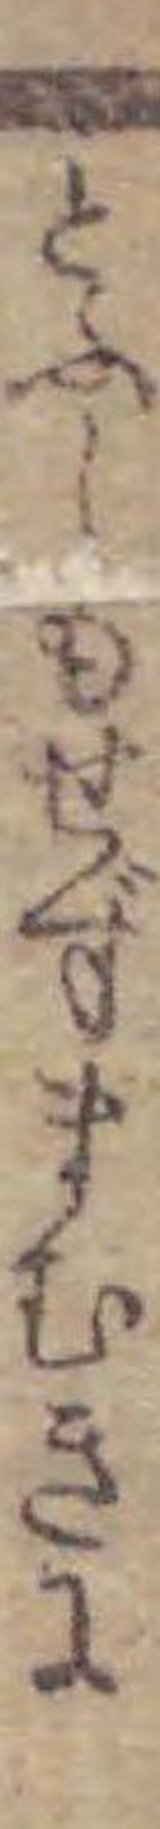とふしもせずまむきに
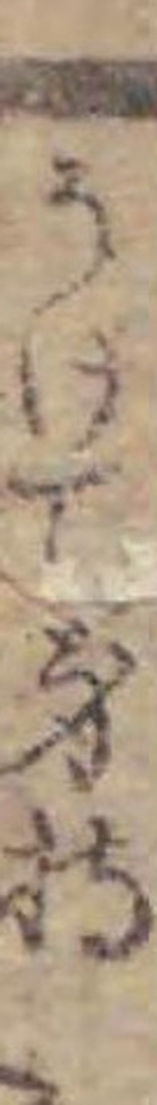うけて身持
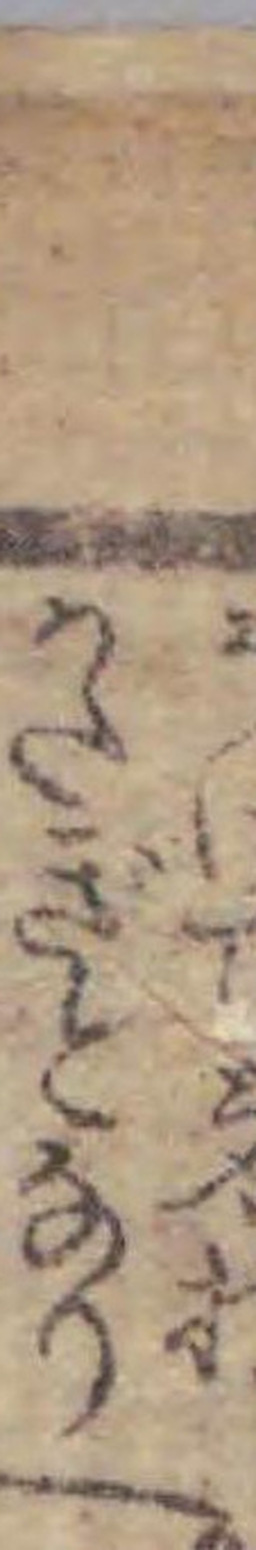かたぎとなり
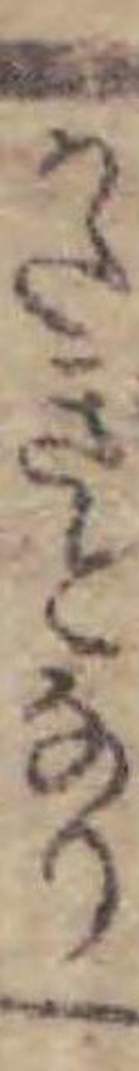かたぎとなり
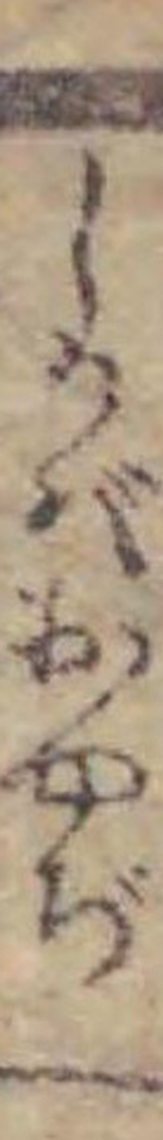しかばおやぢ
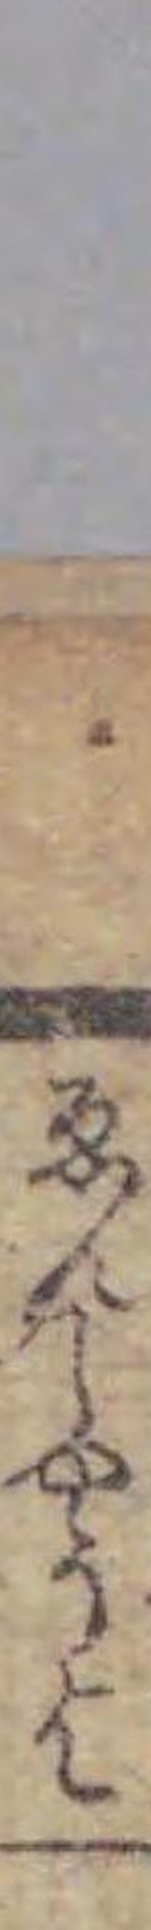ゑんしやうよ
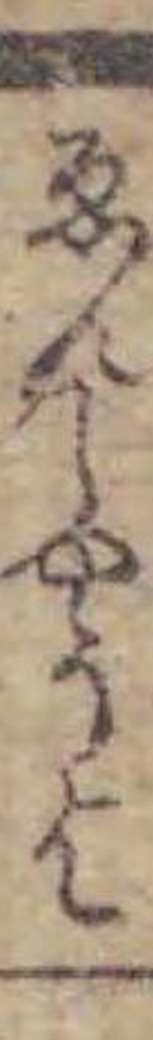ゑんしやうよ
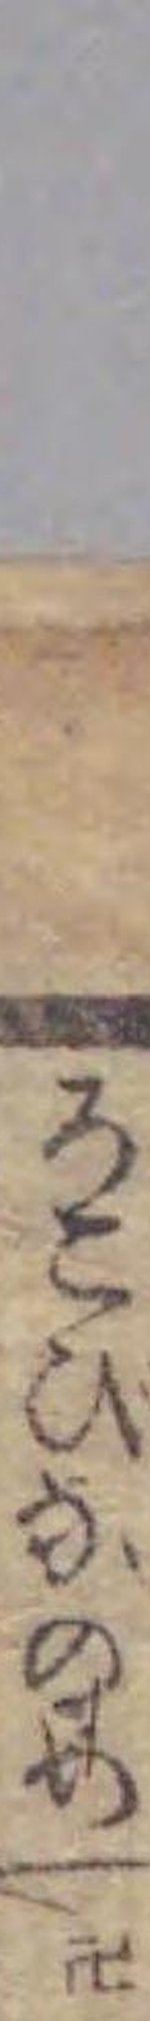ろこびなのめ
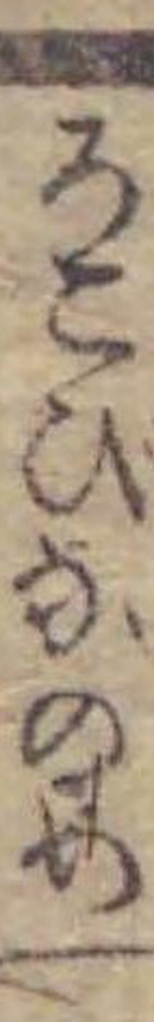ろこびなのめ
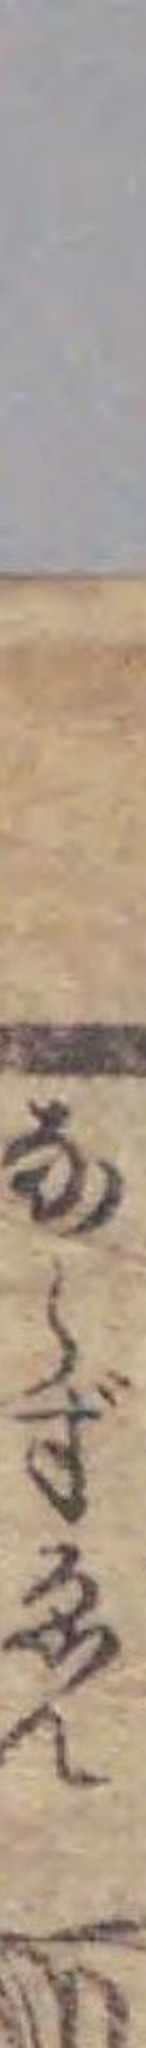ならずゑん
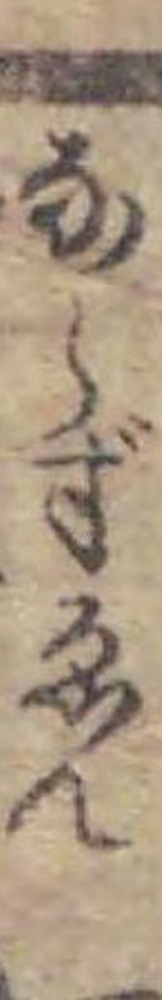ならずゑん
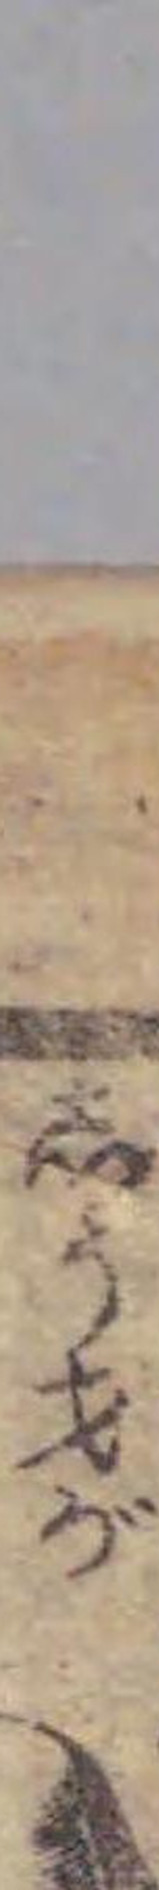しう才が
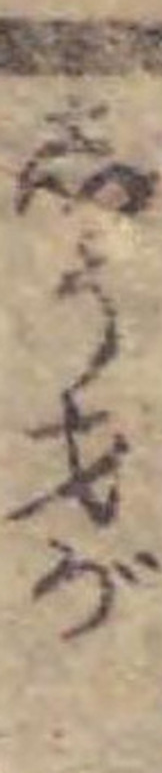しう才が
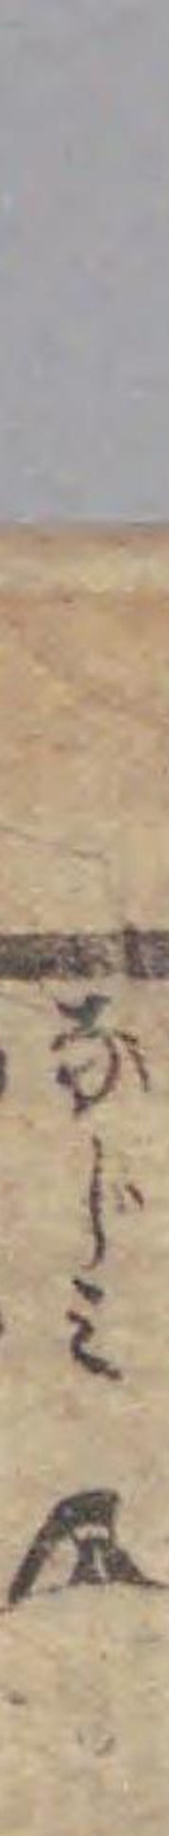なじみ
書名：此奴和日本 : 2巻
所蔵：国立国会図書館 National Diet Library, JAPAN
